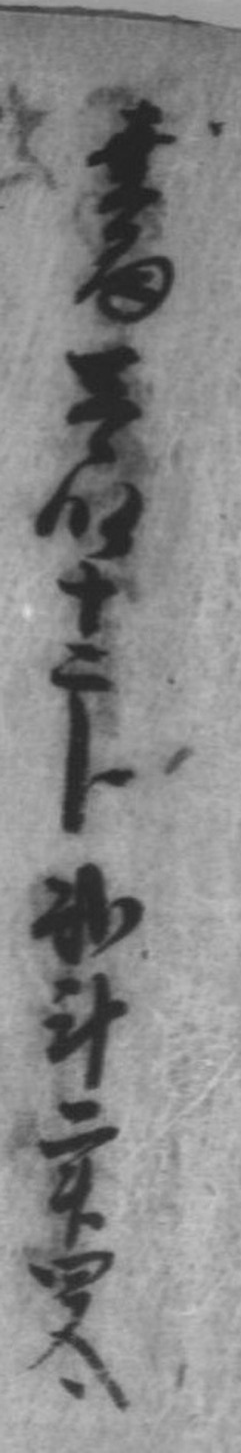桑畠壱畝十二分弐斗二升四合同人
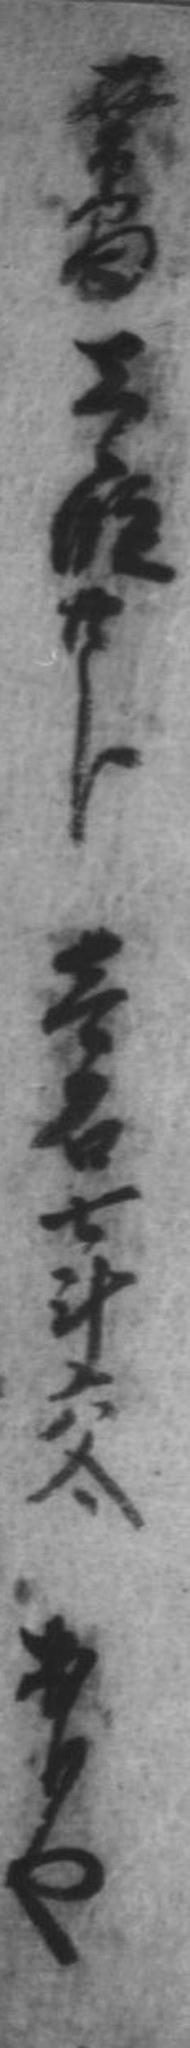桑畠壱段廿分壱石七斗六合おりや

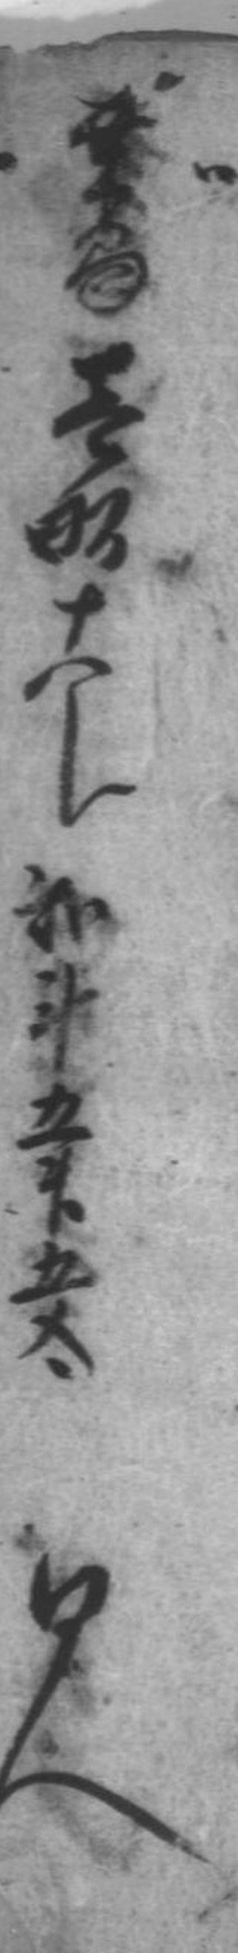桑畠壱畝十八分弐斗五升五合同人
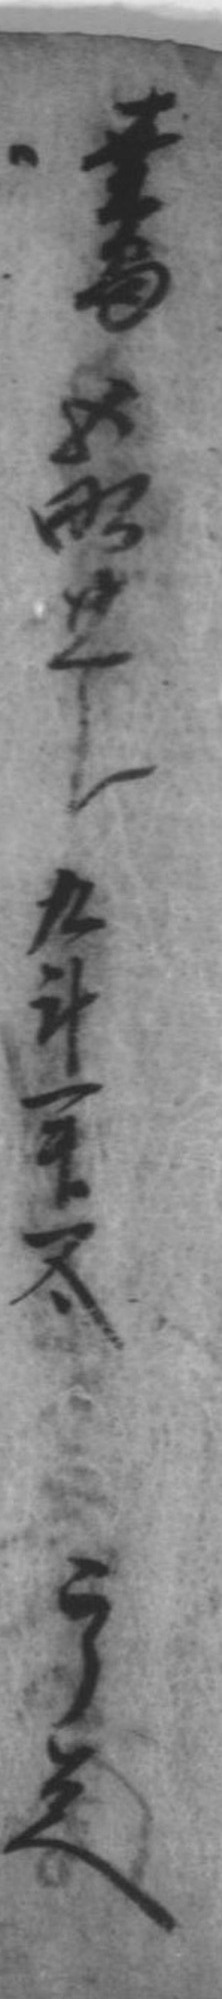桑畠五畝廿一文九斗一升一合二郎兵衛

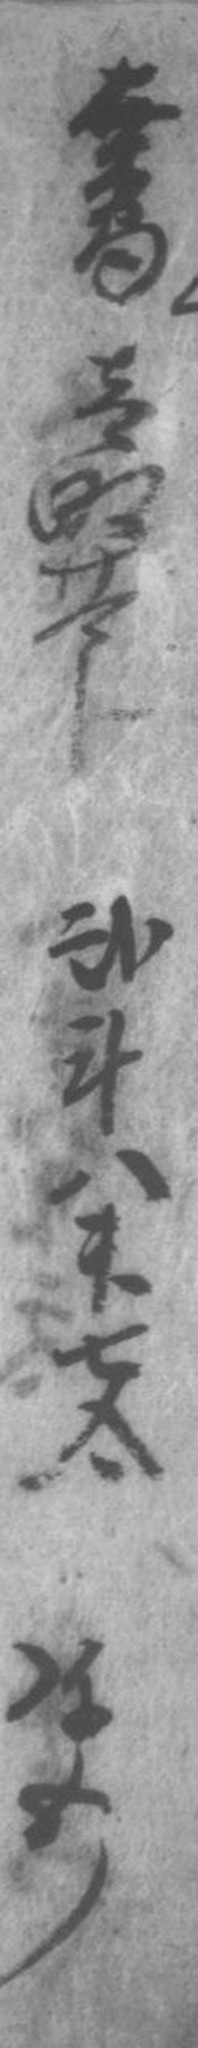桑畠壱畝廿四分弐斗八升七合弥五郎
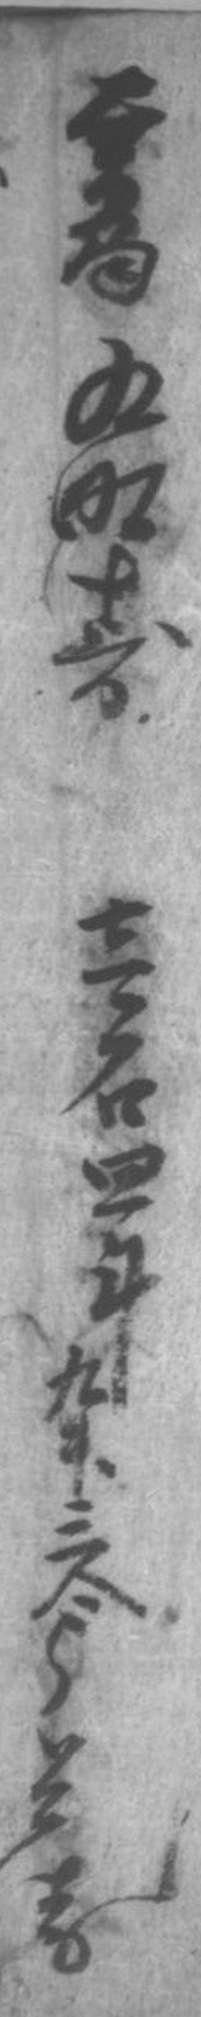桑畠九畝十歩壱石四斗九升三合与兵衛
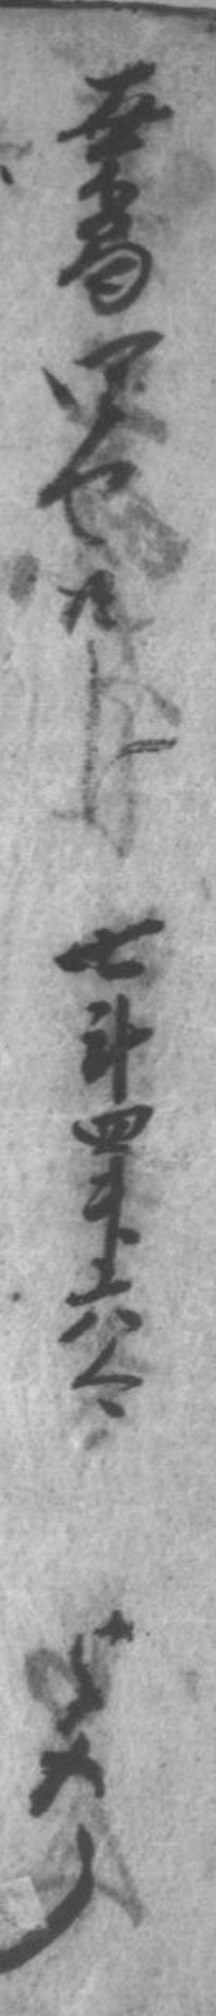桑畠四せ廿分七斗四升六合与五郎
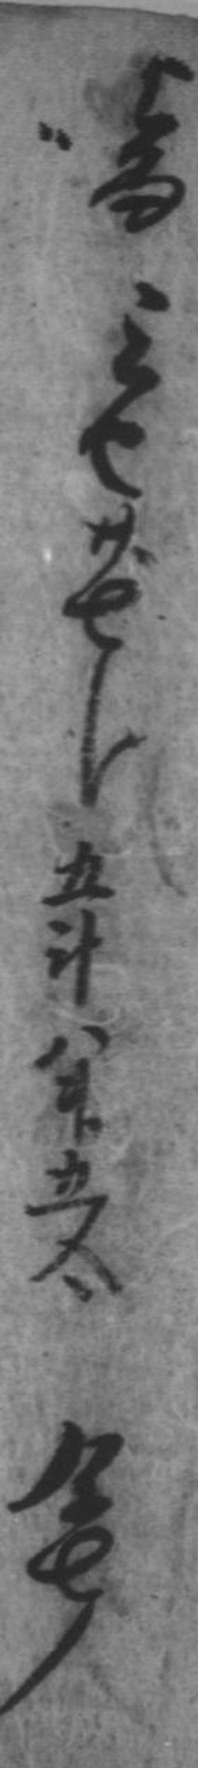上畠三せ廿七分五斗八升五合弥七郎
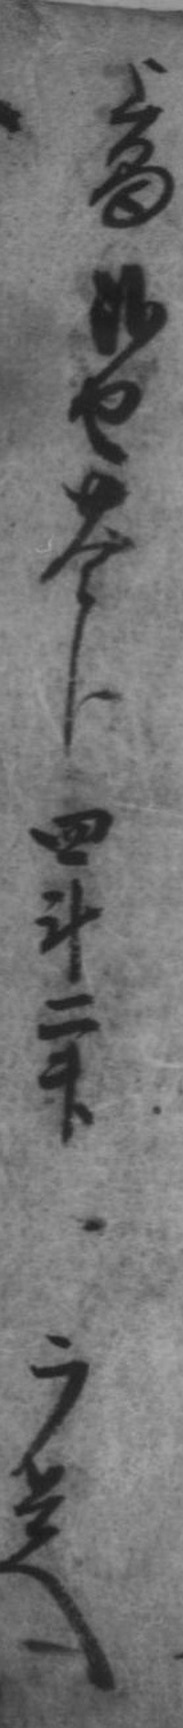上畠弐せ廿八分四斗二升二郎兵衛

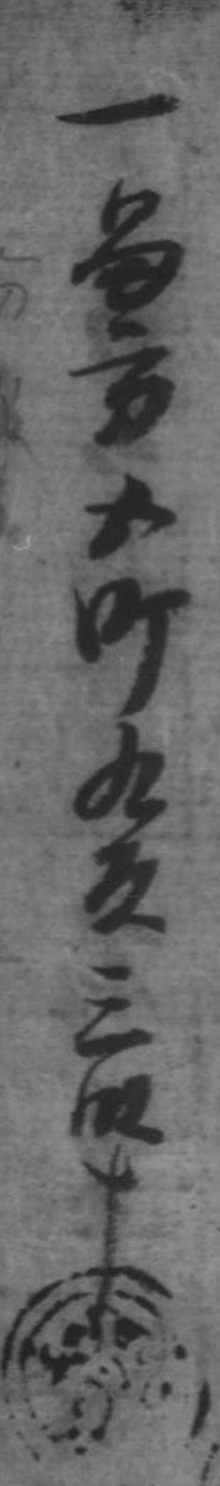一畠方五町九反三畝十歩㊞

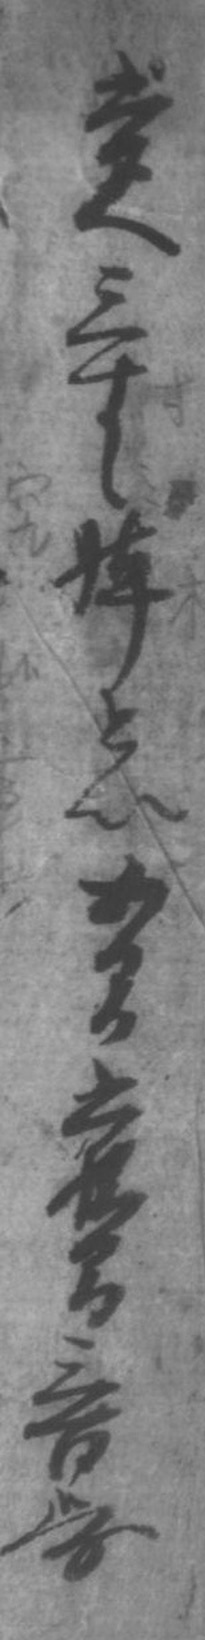一六尺三寸之棹を以五間六拾間三百歩
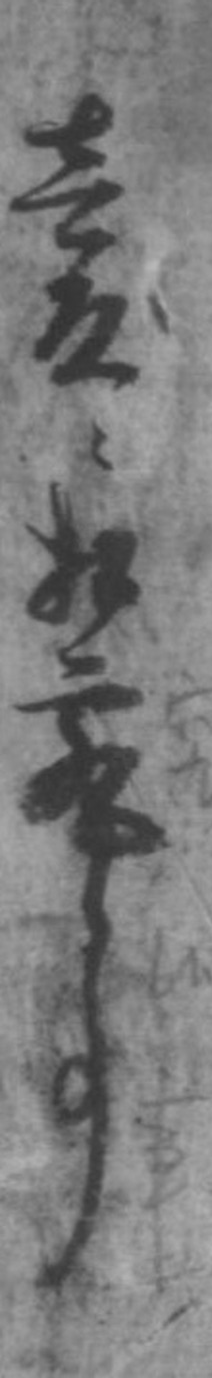壱反二相定候事
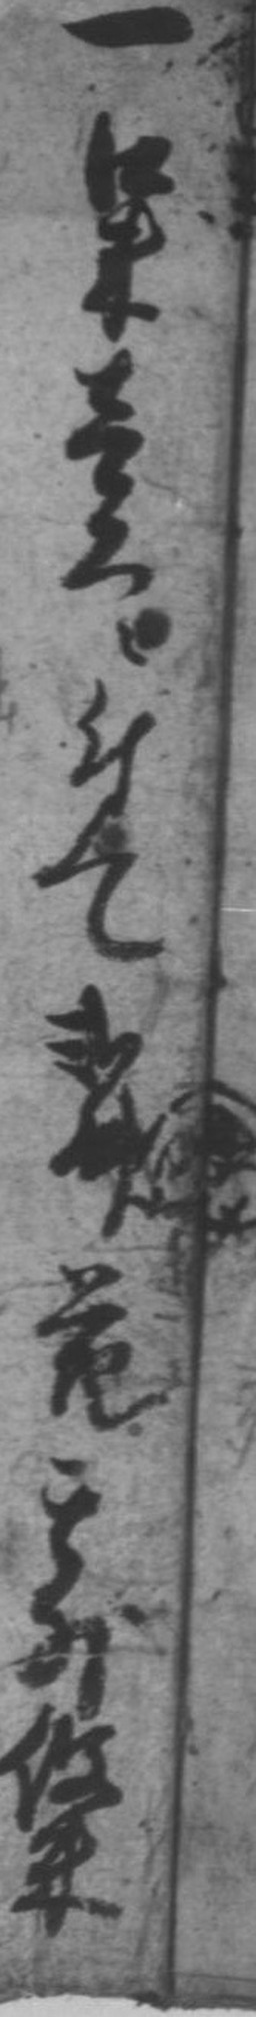一口米壱石二付而弐升宛其外役米
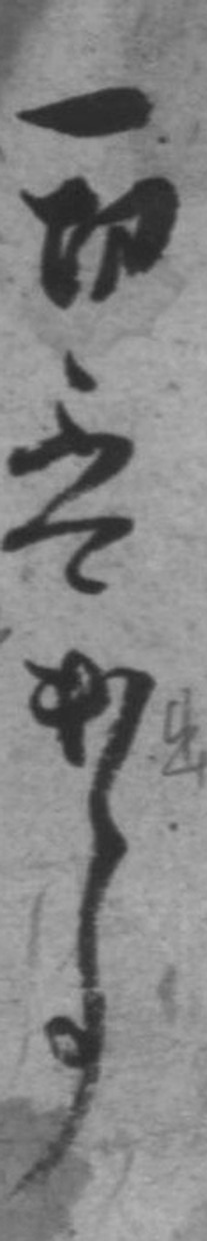一切不可出事
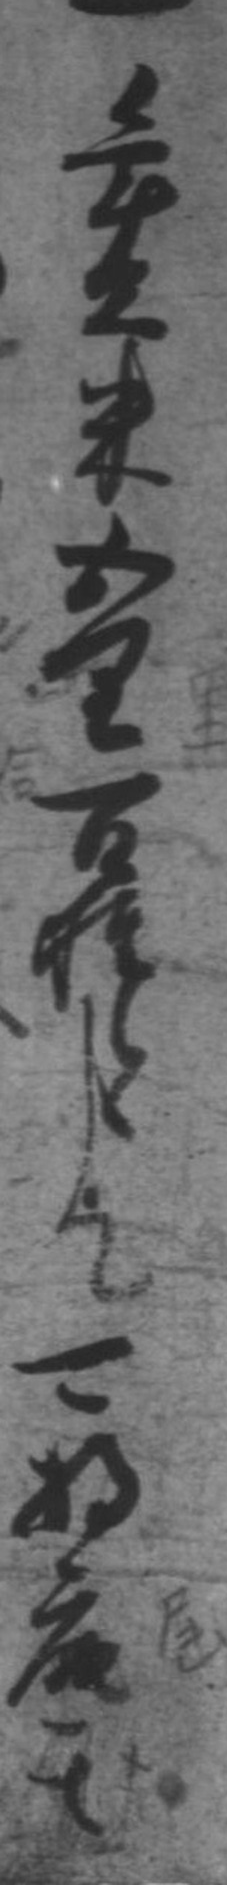一年貢米五里百姓として可持届其
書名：越州大野郡ノ内不動堂村御検地帳
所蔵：福井県文書館 Fukui Prefectural Archives
